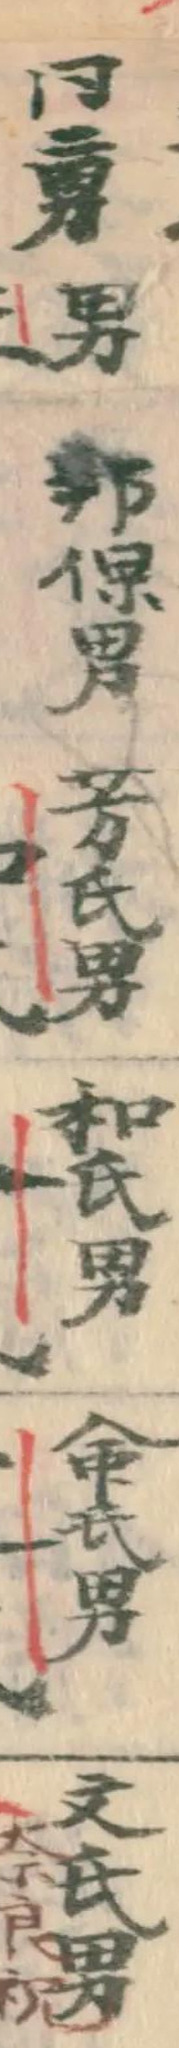同二男邦保男芳氏男和氏男命氏男文氏男
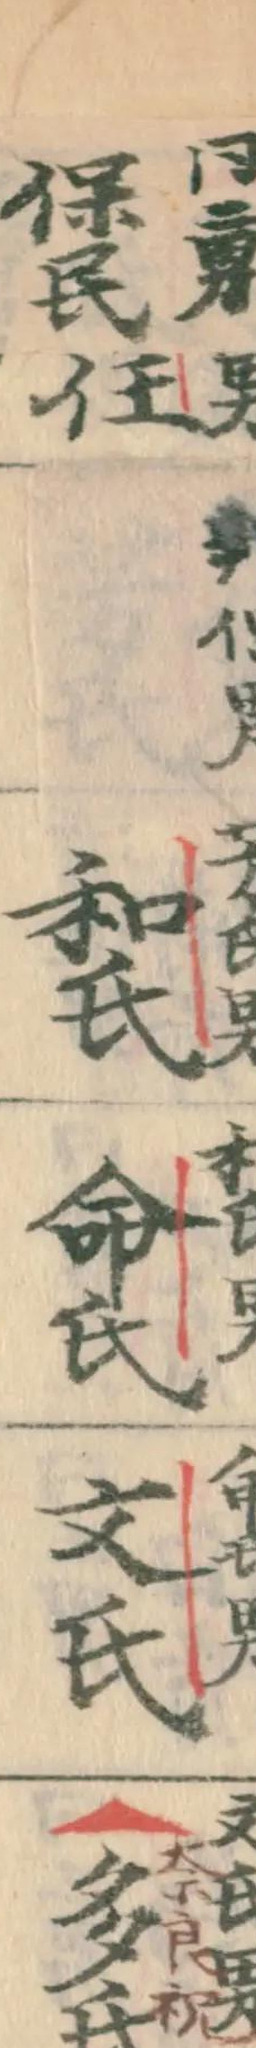保民和氏命氏文氏▲多氏
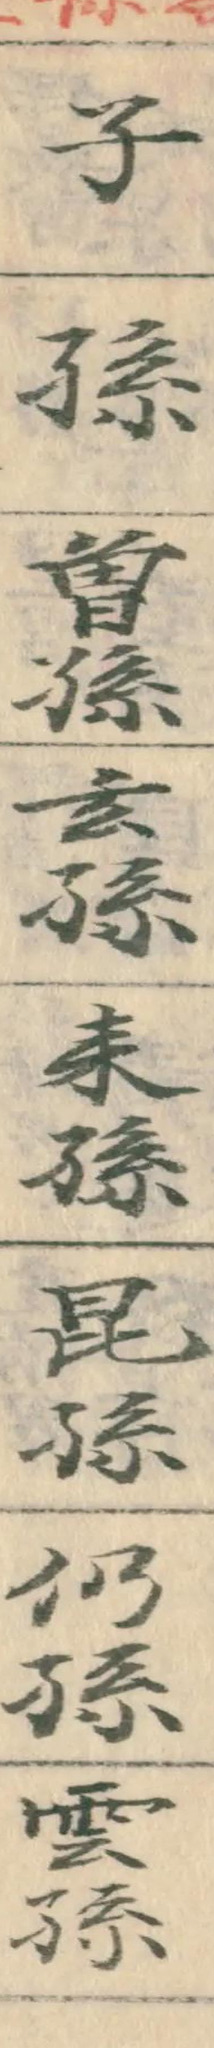子孫曽孫玄孫来孫昆孫仍孫雲孫
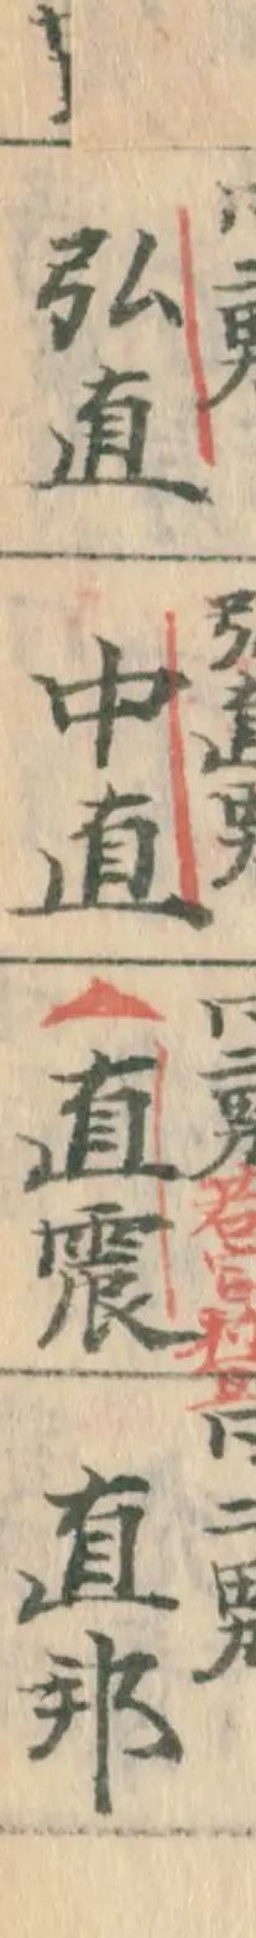弘直中直▲直震直邦

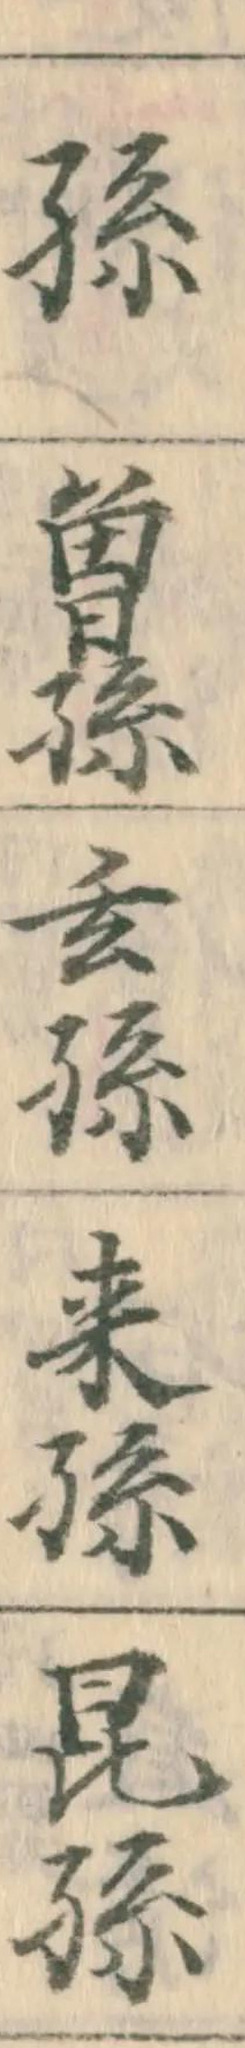孫曽孫玄孫来孫昆孫
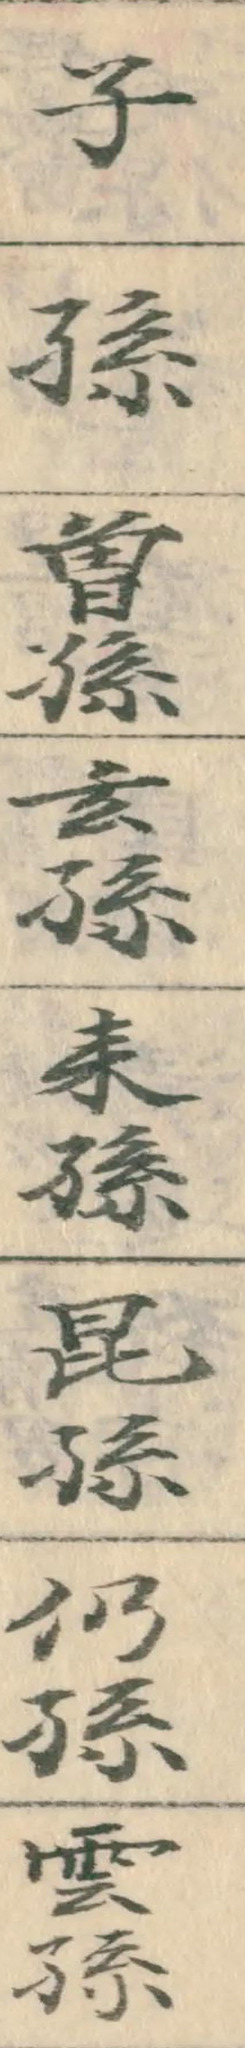子孫曽孫玄孫来孫昆孫仍孫雲孫

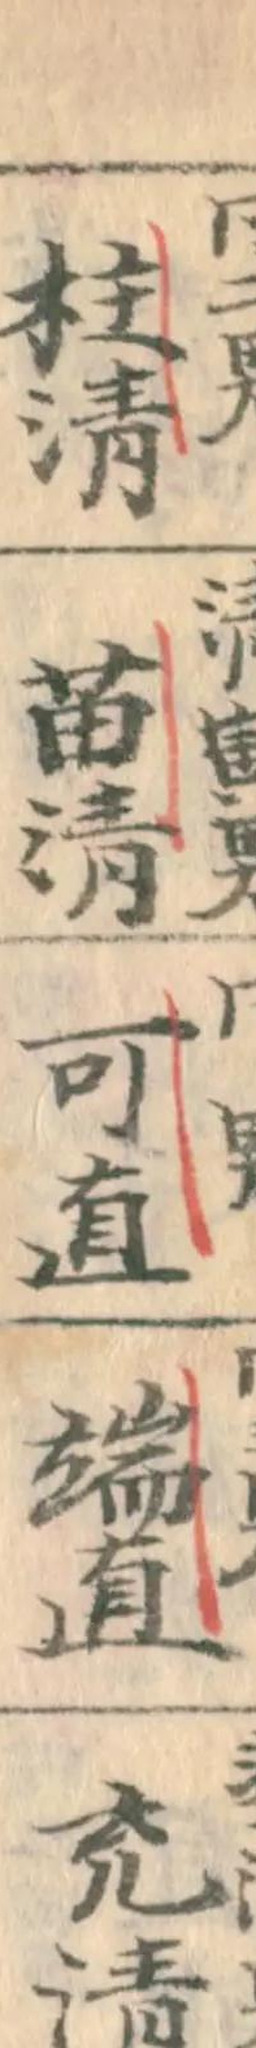柱清苗清可直端直充清
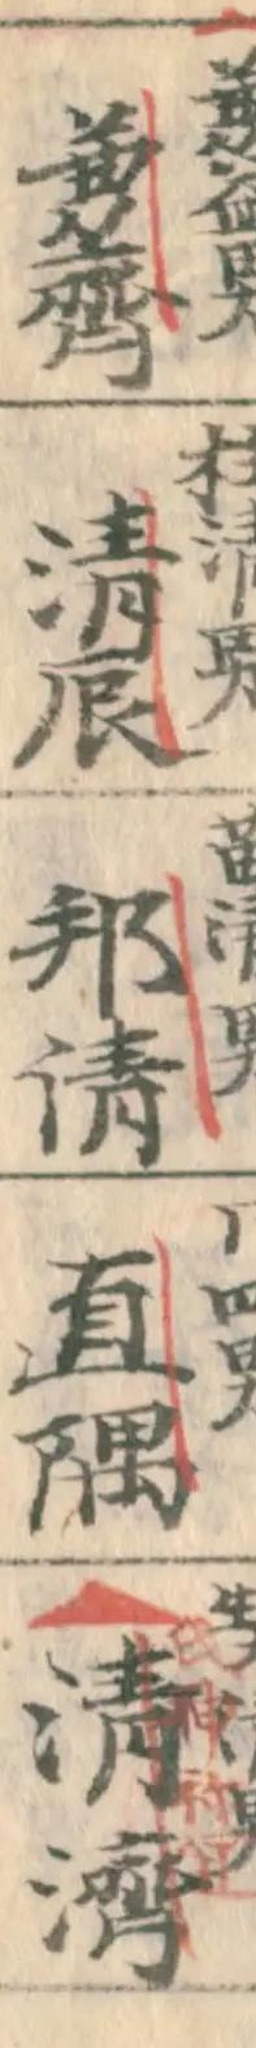兼齊清辰邦清直隅▲清濟
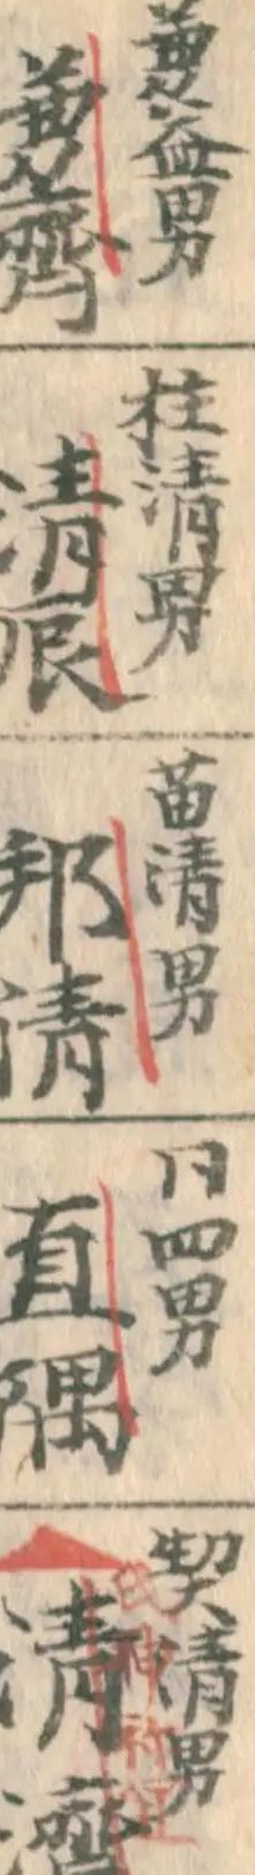兼齊清辰邦清直隅▲清濟
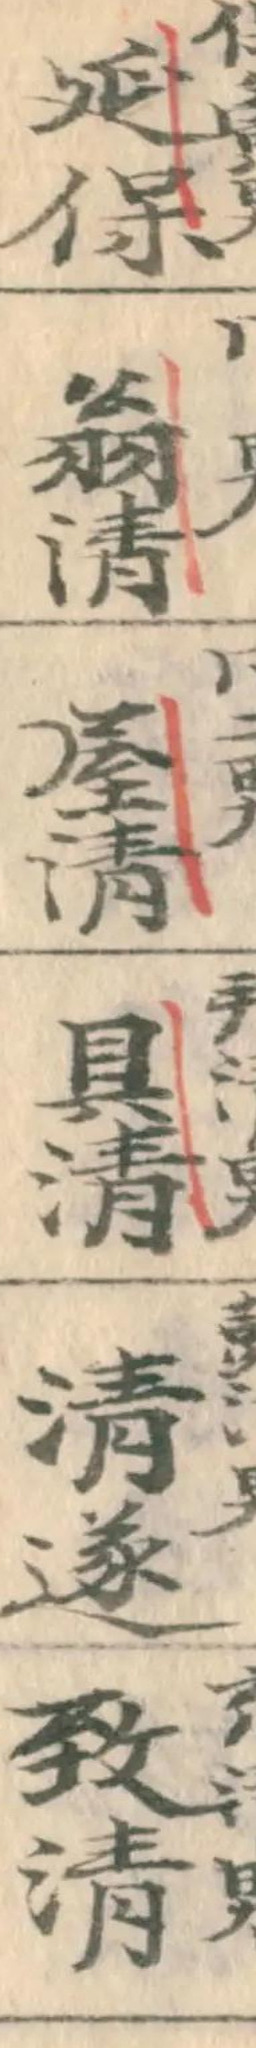延保翁清屋清具清清遂致清
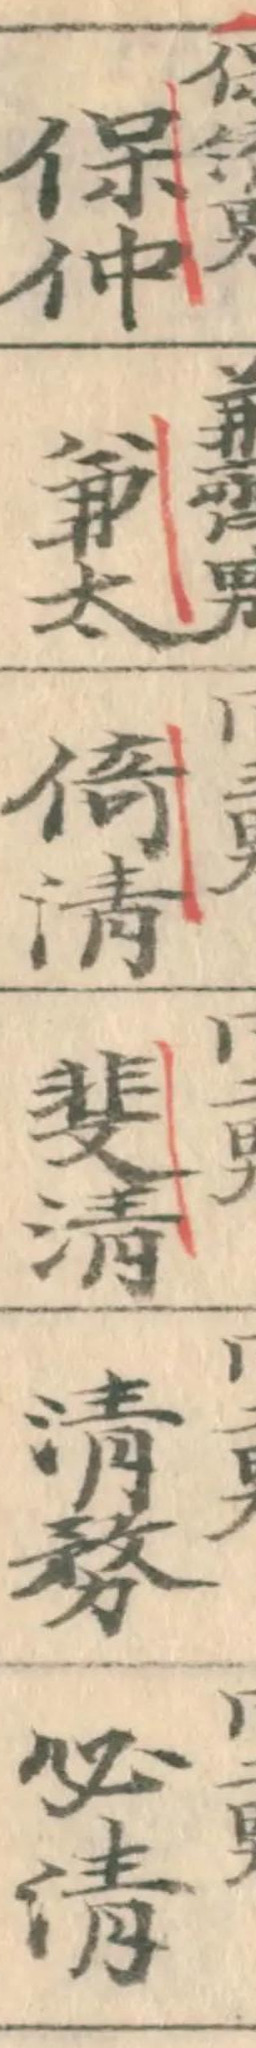保仲兼太倚清斐清清務必清
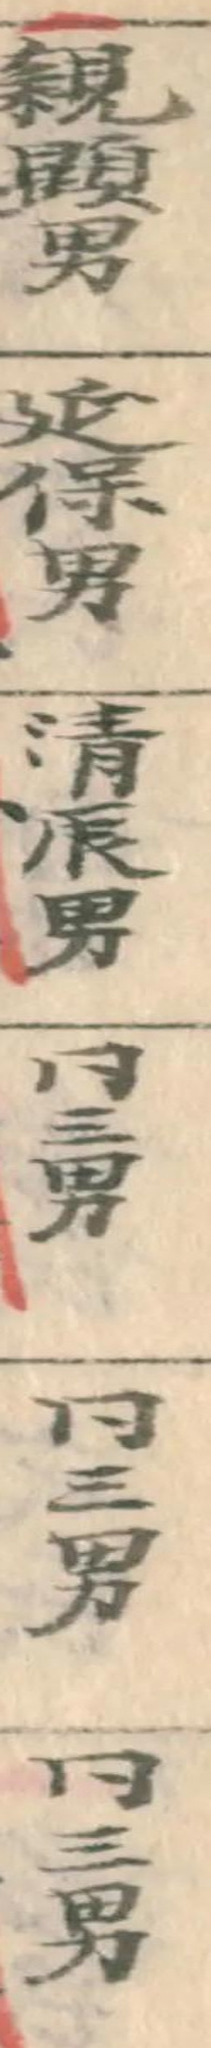▲親顕男延保男清辰男同三男同三男同三男
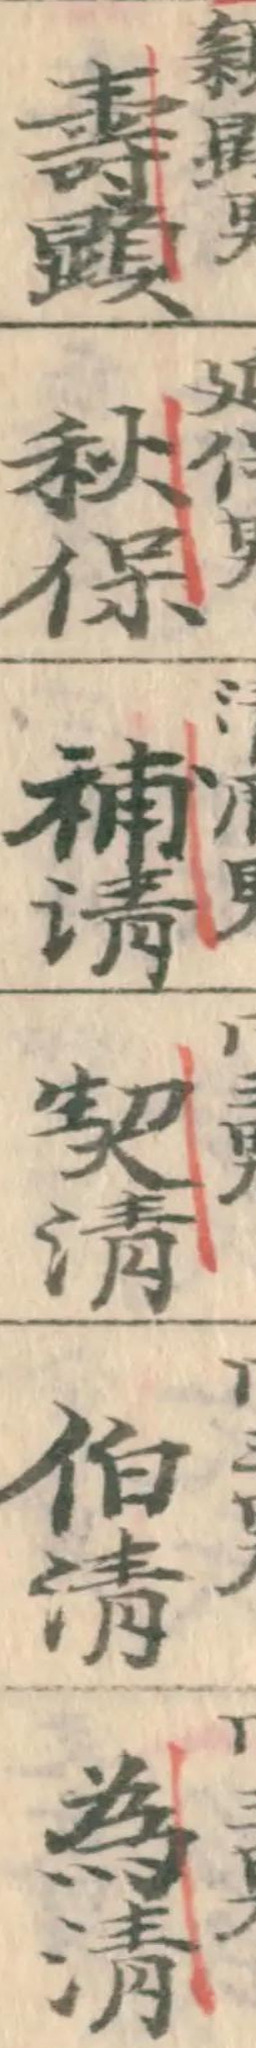壽顕秋保補清契清伯清為清
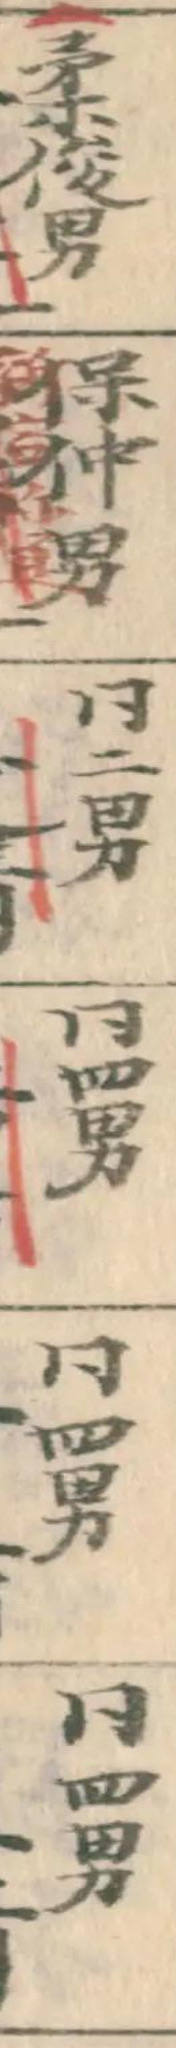▲柔俊男保仲男同二男同四男同四男同四男
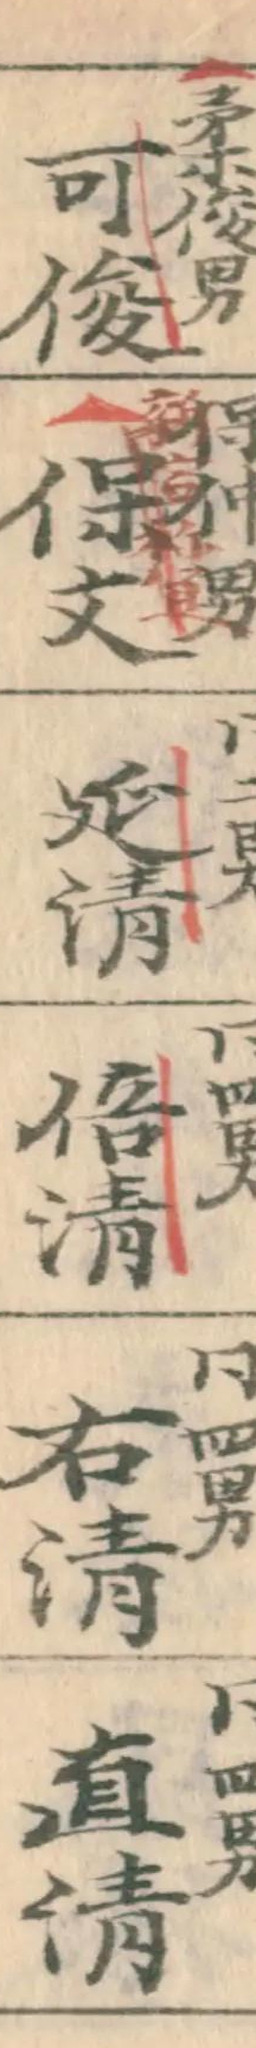可俊▲保文延清倍清右清直清
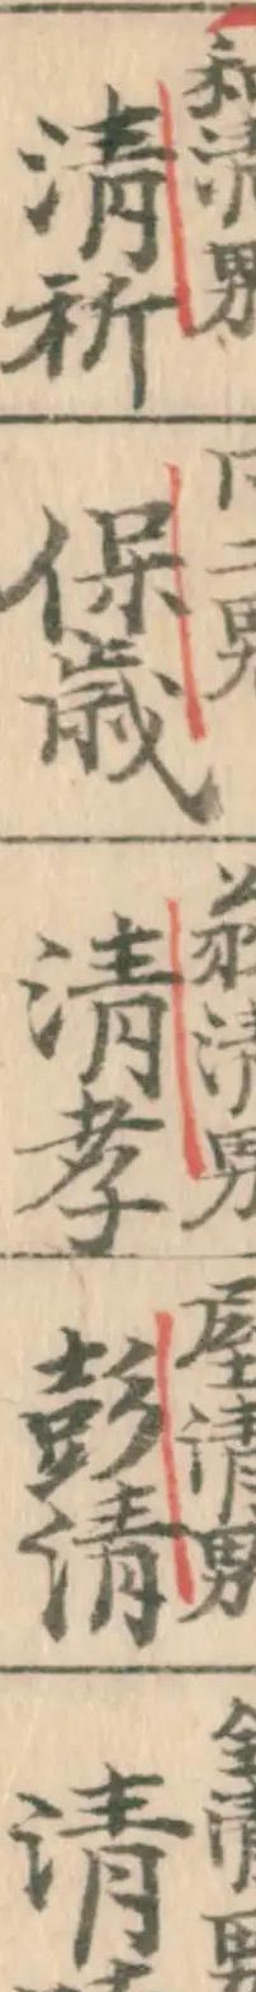清祈保歳清孝彭清清時
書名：賀茂社記録. 第24冊
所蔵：国立国会図書館 National Diet Library, JAPAN
